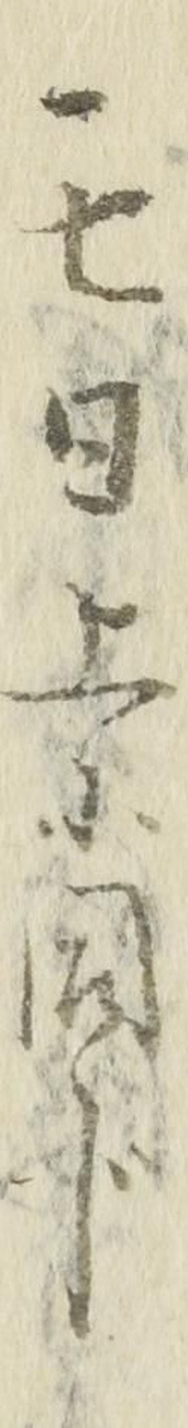、七日上に同じ
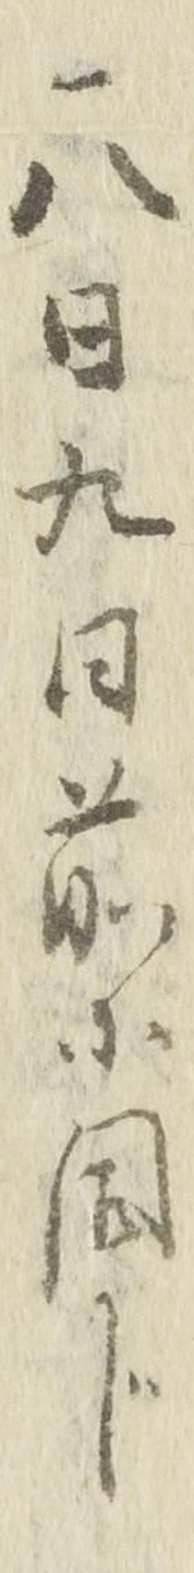、八日九日前に同じ
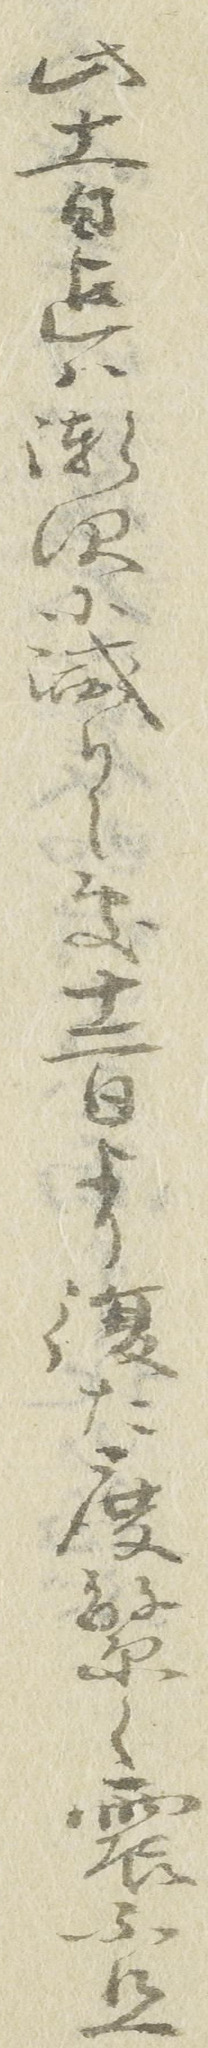此十一日迄は漸次に減りし処十二日より復た度繁く震ふ且
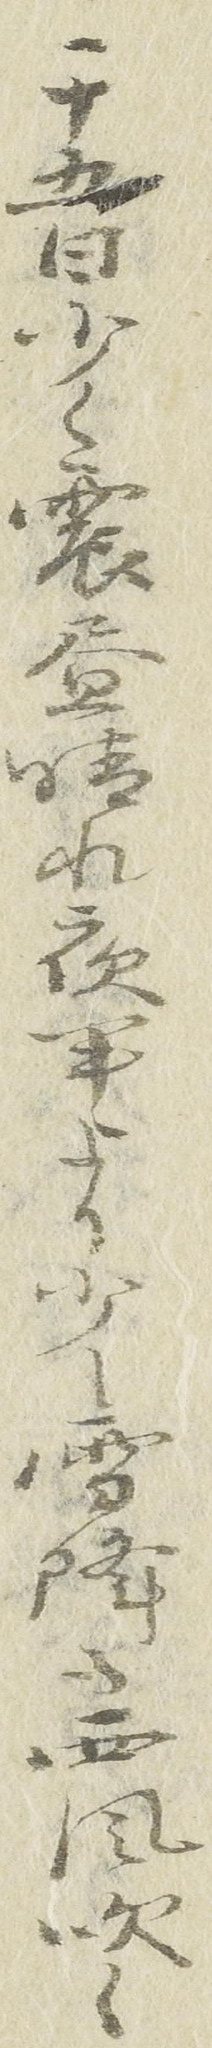、十五日少し震昼晴れ夜半より少し雪降る西風吹く
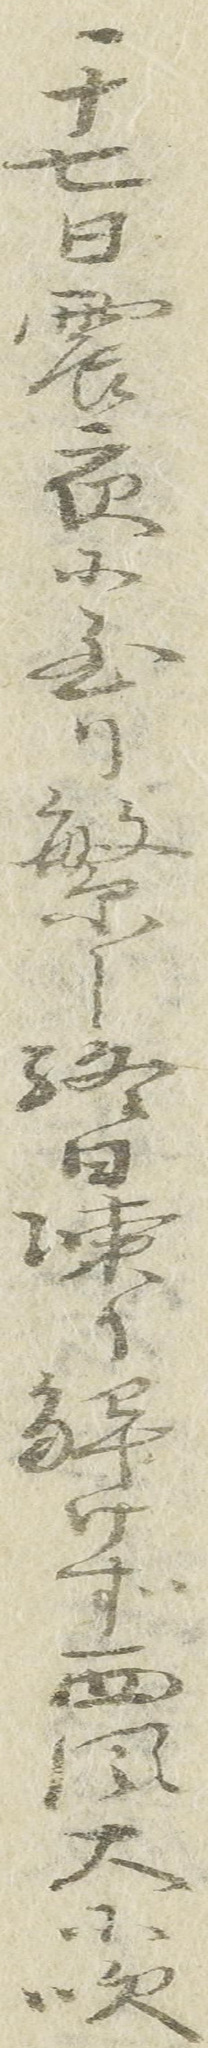、十七日震夜に至り繁し終日凍り解けず西風大に吹

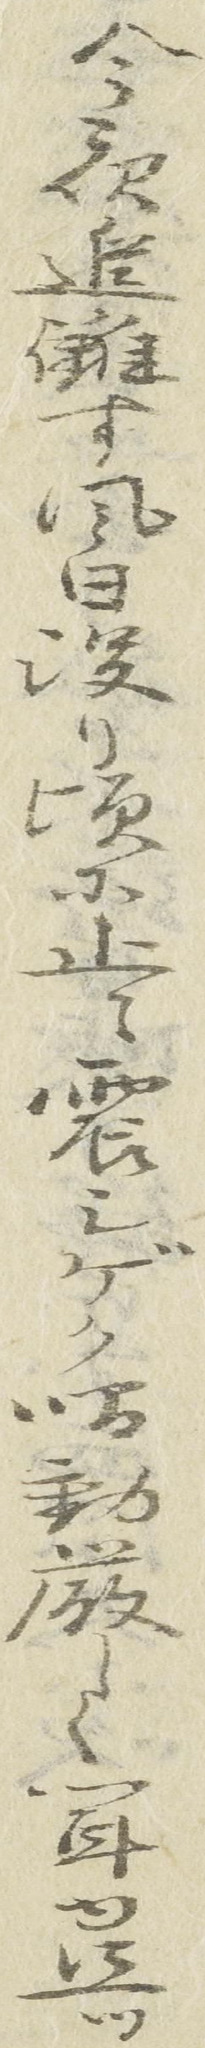今夜追儺す風日没り頃に止て震シゲク鳴動厳しく聞ゆ且つ
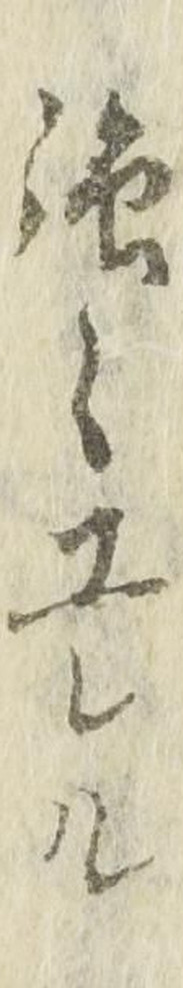強くユレル
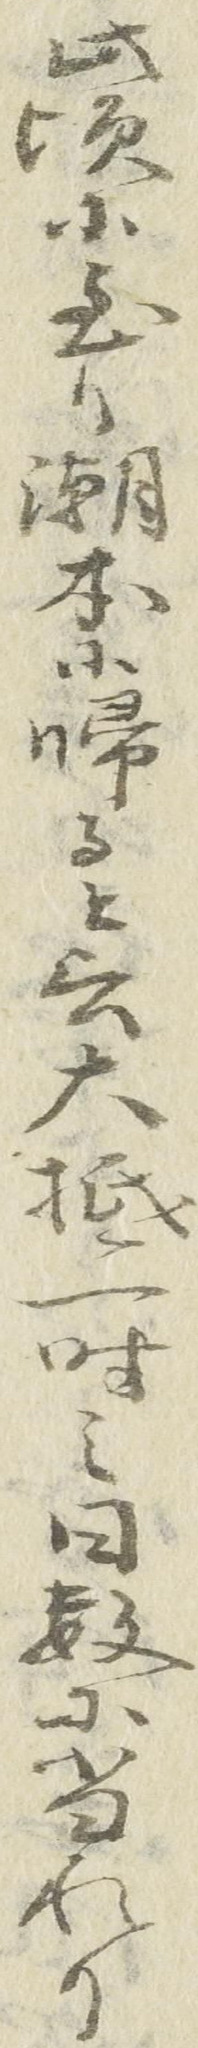此頃に至り潮本に帰ると云大抵一時之日数に当れり
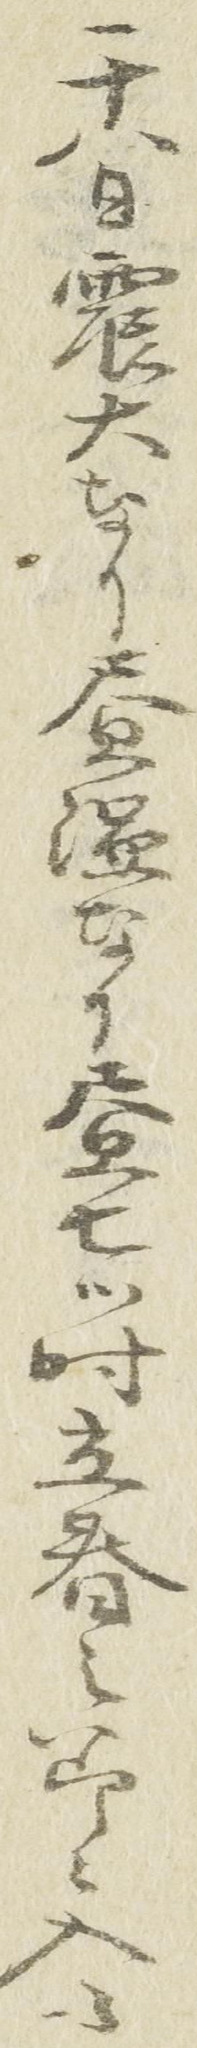、十八日震大なり昼温なり昼七ツ時立春之節ニ入る
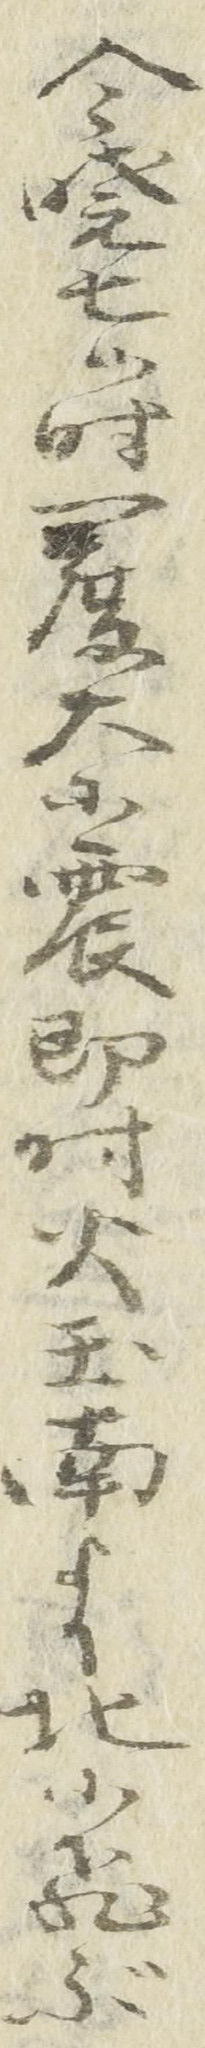今暁七ツ時一度大に震即時火玉南より北に飛ぶ
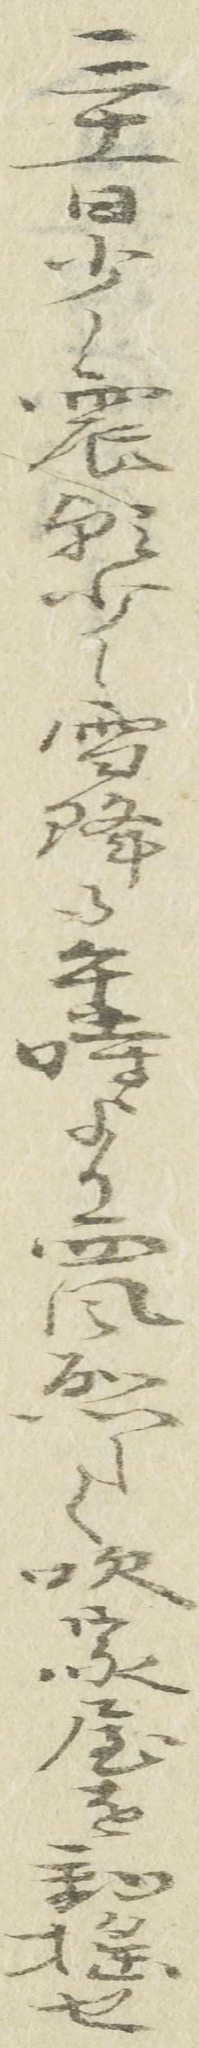、二十一日少し震朝少し雪降る午時より西風烈しく吹家屋を動揺セ
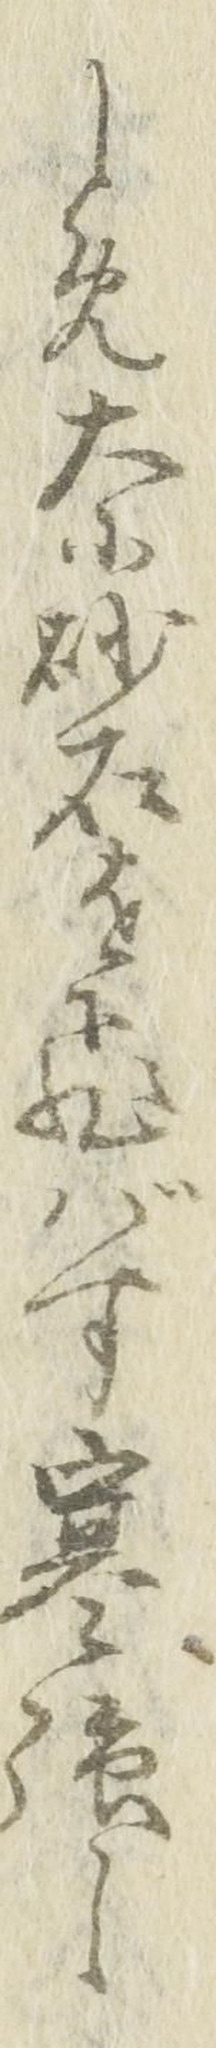しめ大に砂石を飛バす寒強し
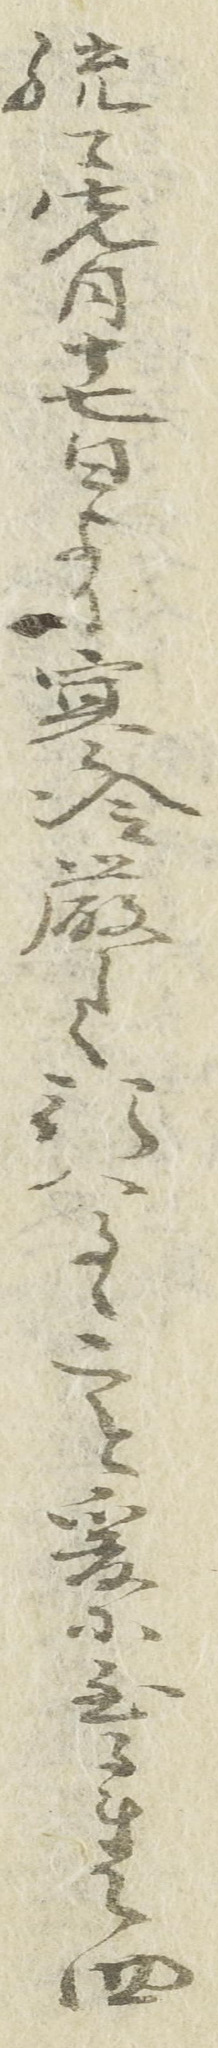統て先月十七日より寒冷厳しく行ハるゝこと爰に至るまて四
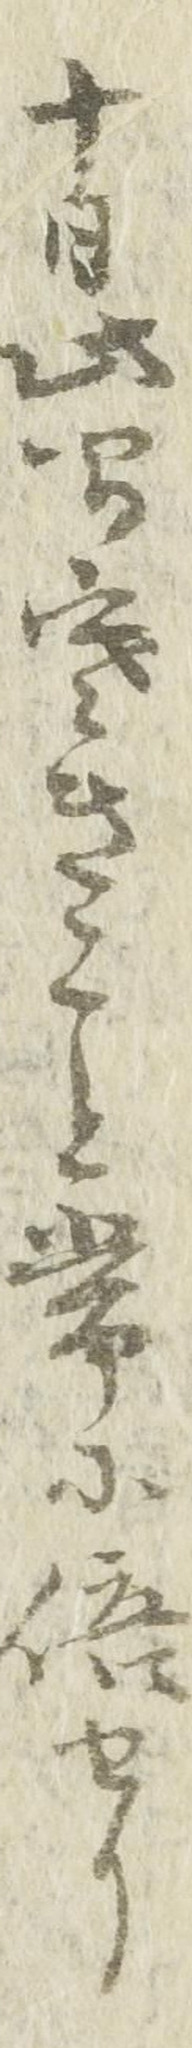十日此間寒きこと常に倍セり
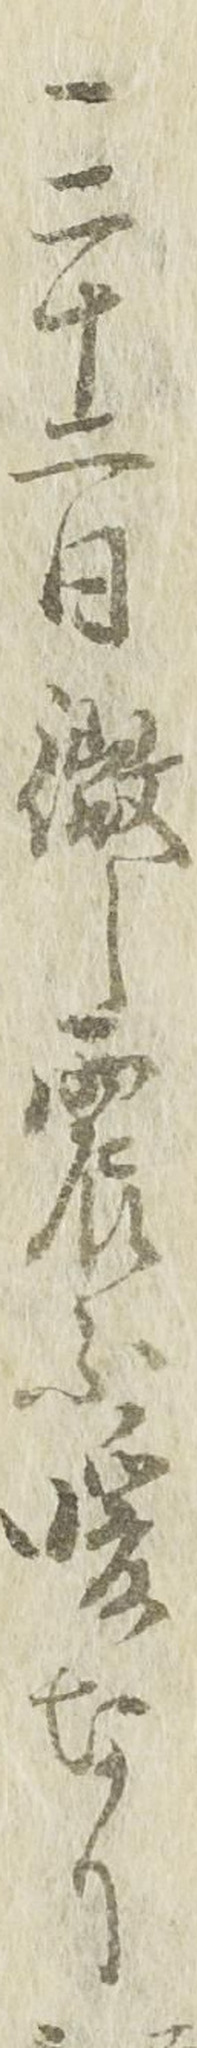、二十五日少し震ふ温なり
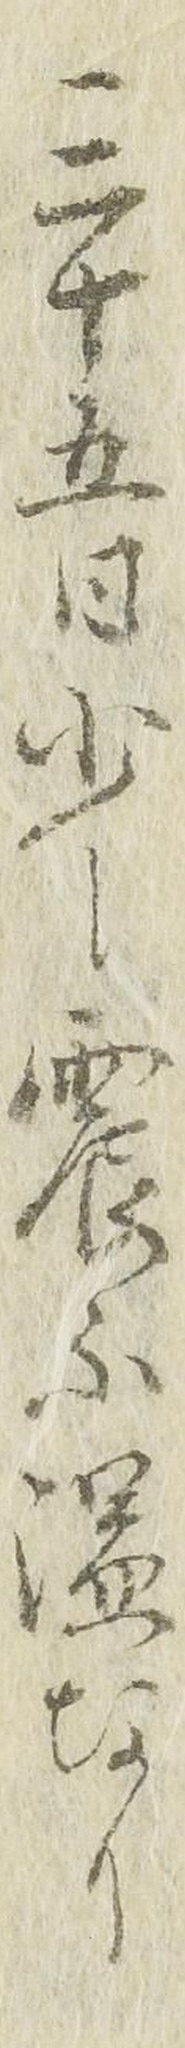、二十五日少し震ふ温なり
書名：地震前兆集　全
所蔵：東京大学地震研究所図書室 Earthquake Research Institute Library, The University of Tokyo, JAPAN
